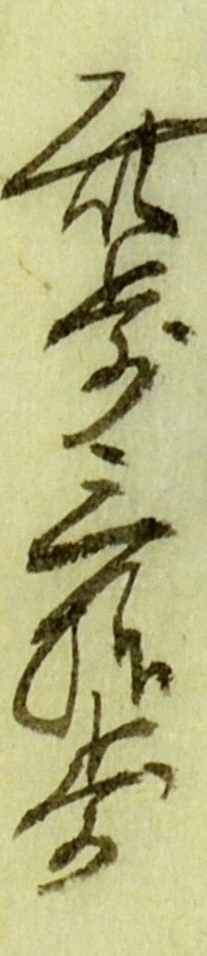此歩三拾歩

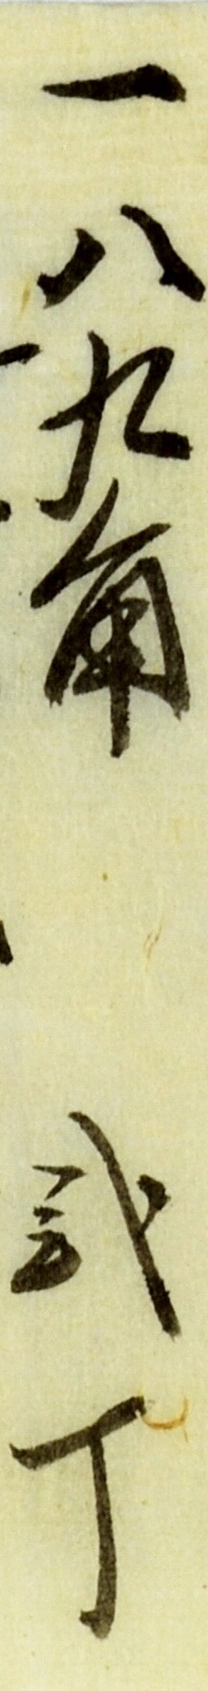一八九角弐丁
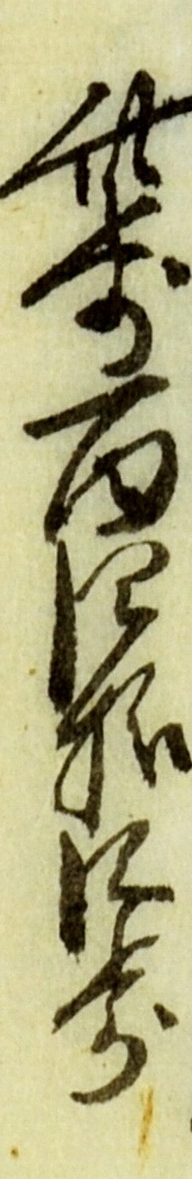此歩百四拾四歩
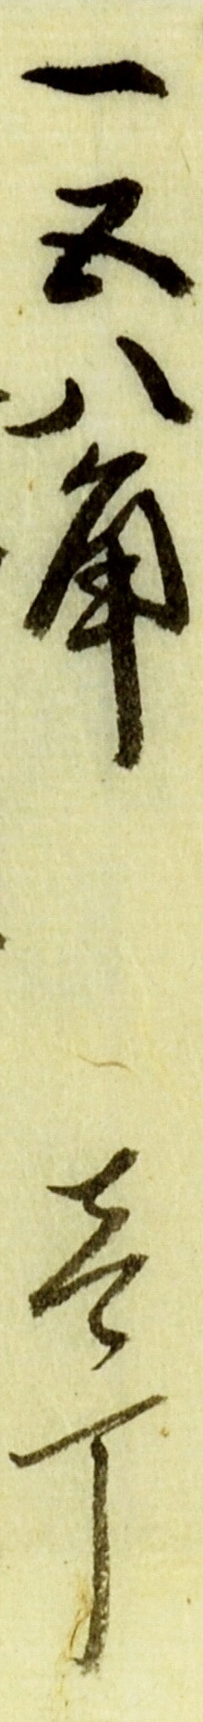一五八角壱丁
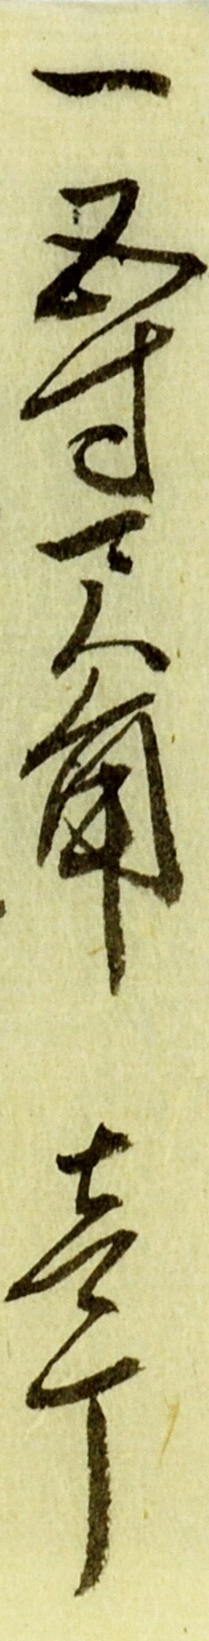一五寸尺角壱丁
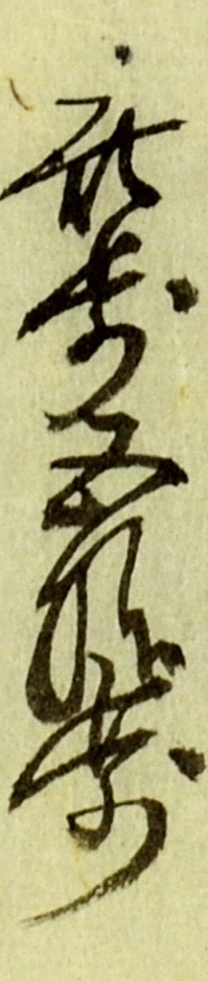此歩五拾歩
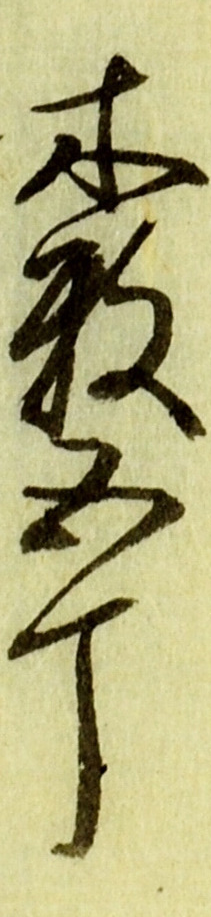木数五丁
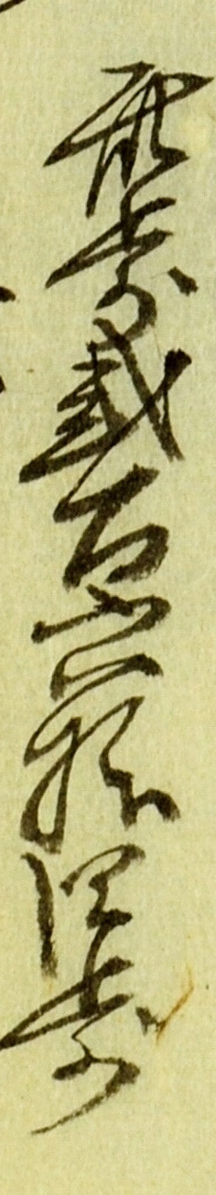〆此歩弐百六拾四歩
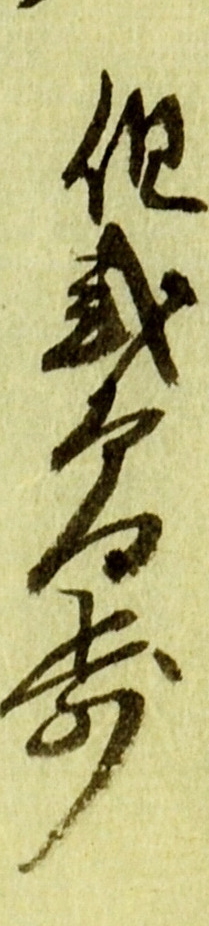但弐間歩
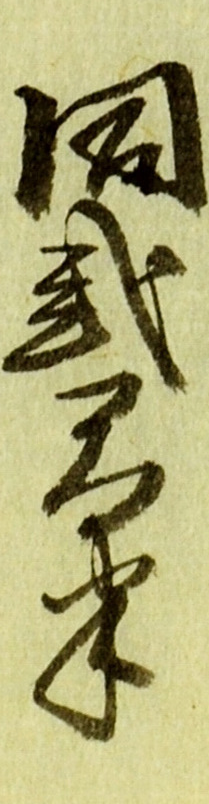同弐間半
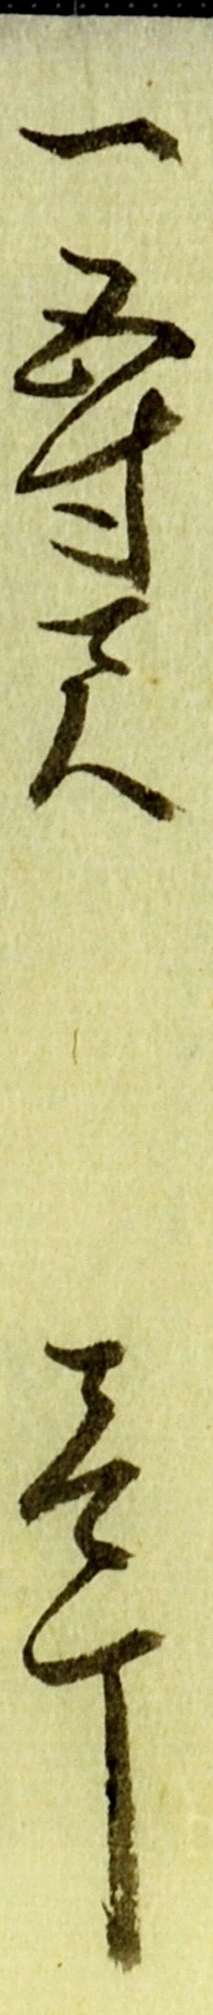一五寸尺壱丁
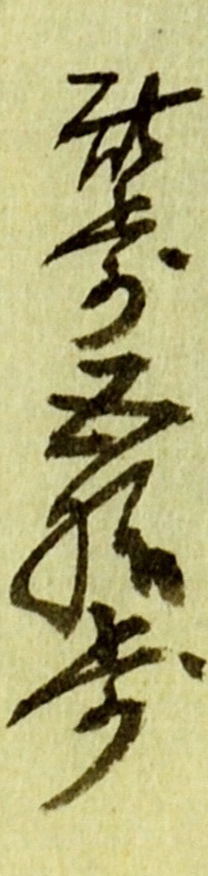此歩五拾歩
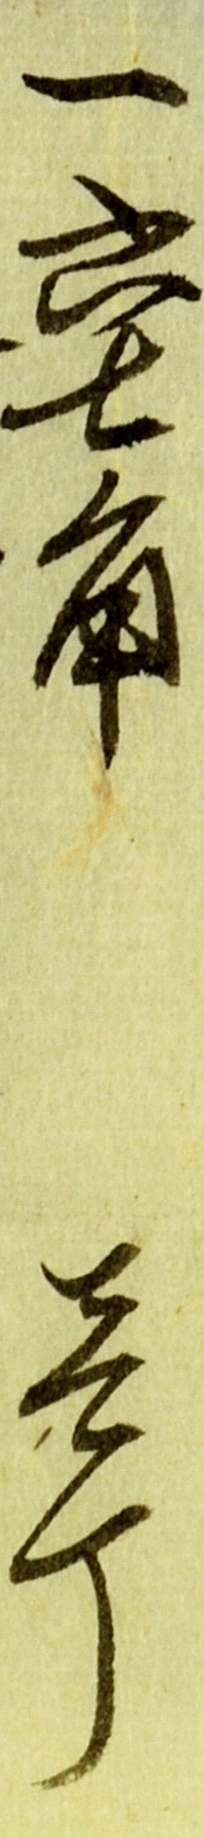一六七角壱丁
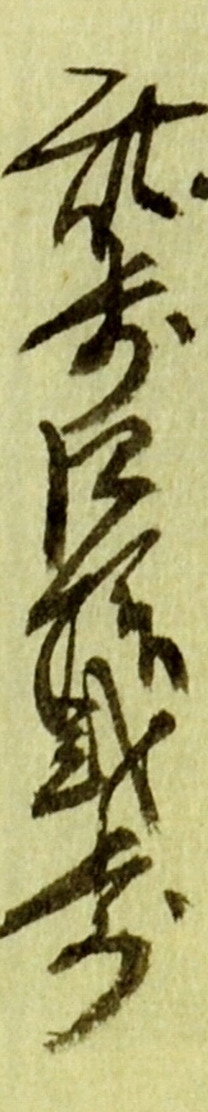此歩四拾弐歩
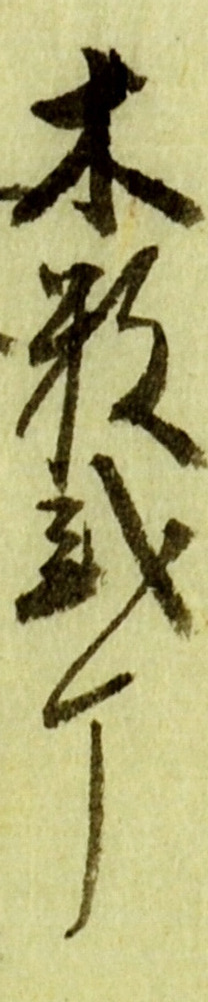木数弐丁
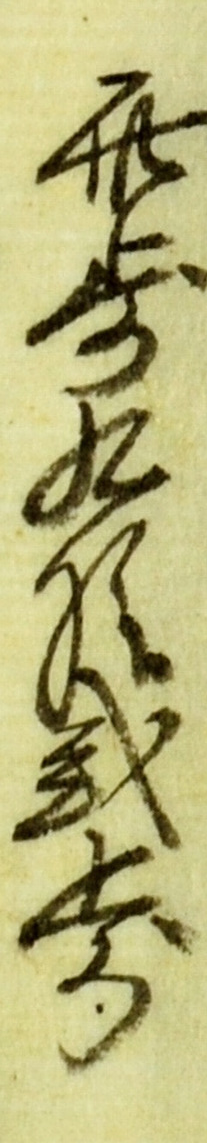〆此歩九拾弐歩
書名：材木川下ケ分一上納帳
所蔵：伊那市立高遠町図書館・合同会社AMANE
